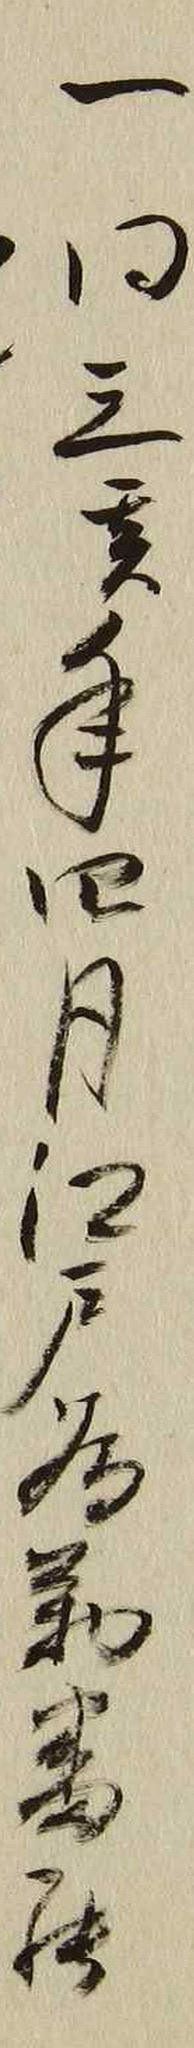一同三亥年四月江戸為勤番罷
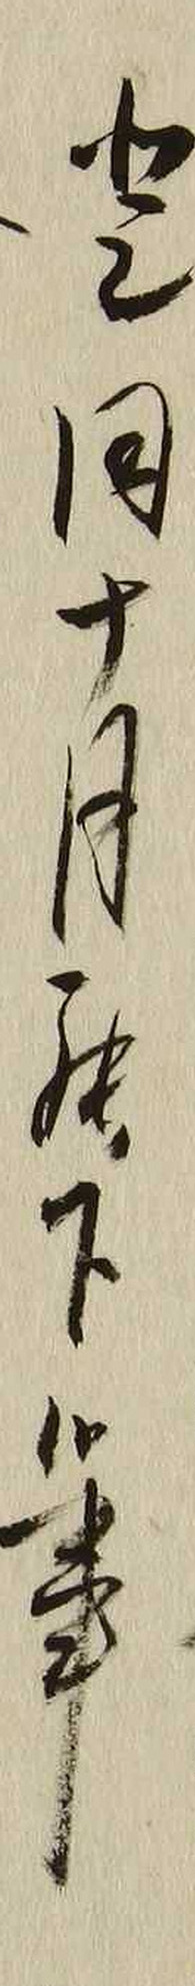登同十月罷下候事
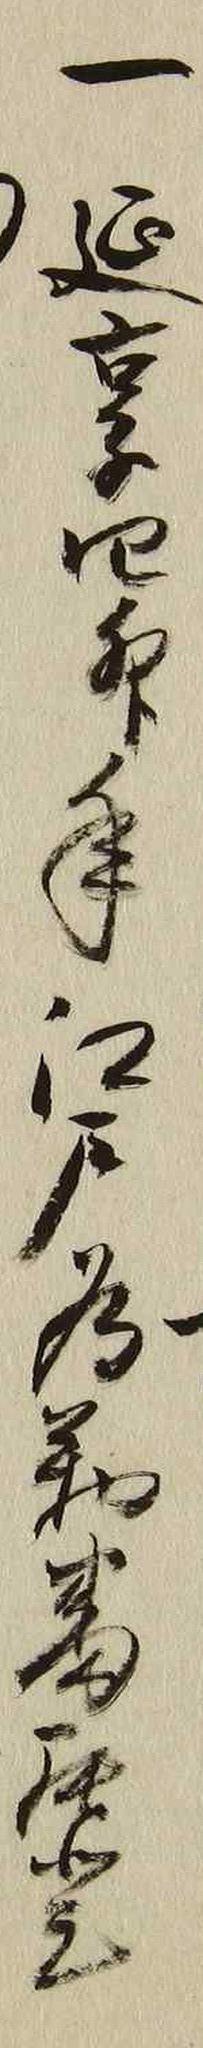一延享四卯年江戸為勤番罷登
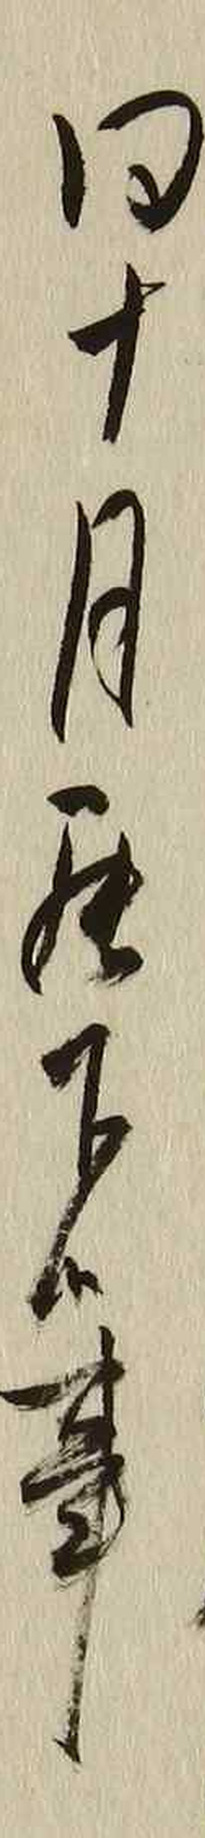同十月罷下候事
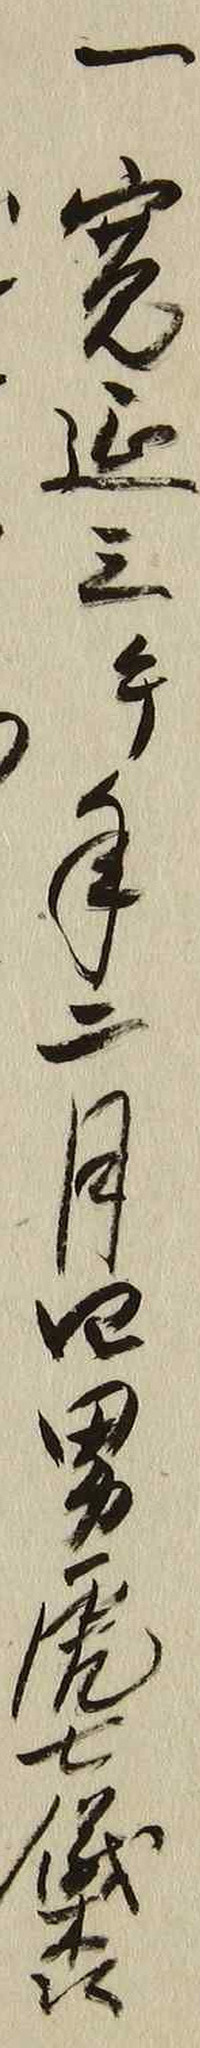一寛延三午年二月四男寅七儀森
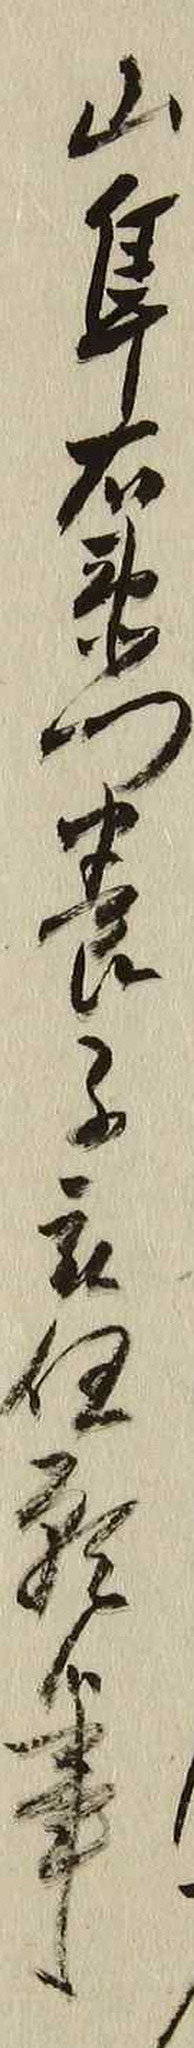山隼右衛門養子被任願候事
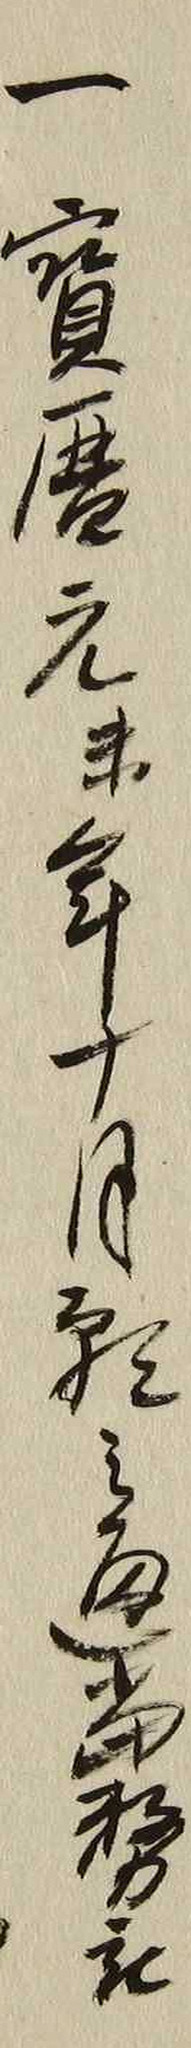一宝暦元未年十月願之通当務被
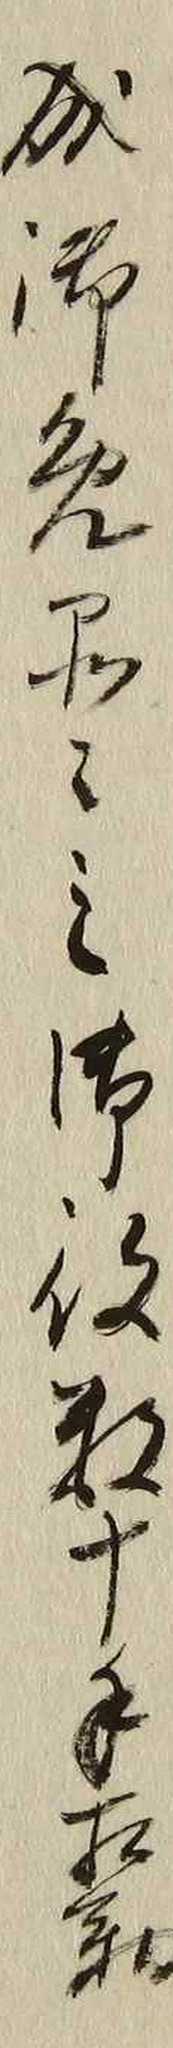成御免品々之御役数十年相勤
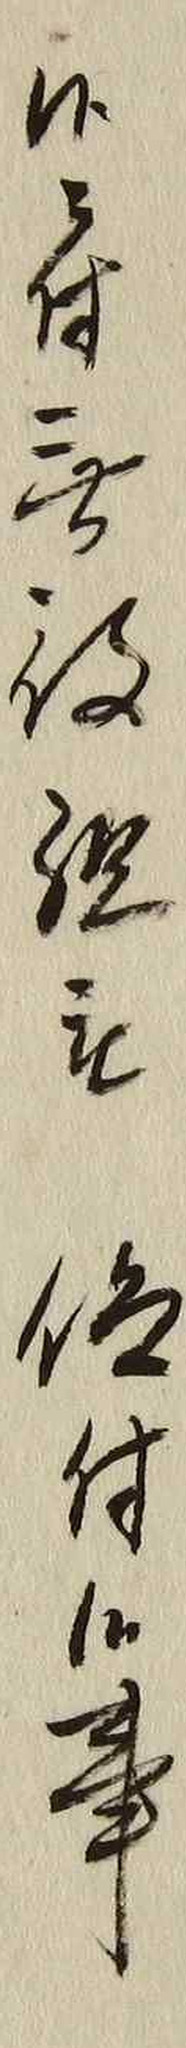候ニ付無役組被仰付候事
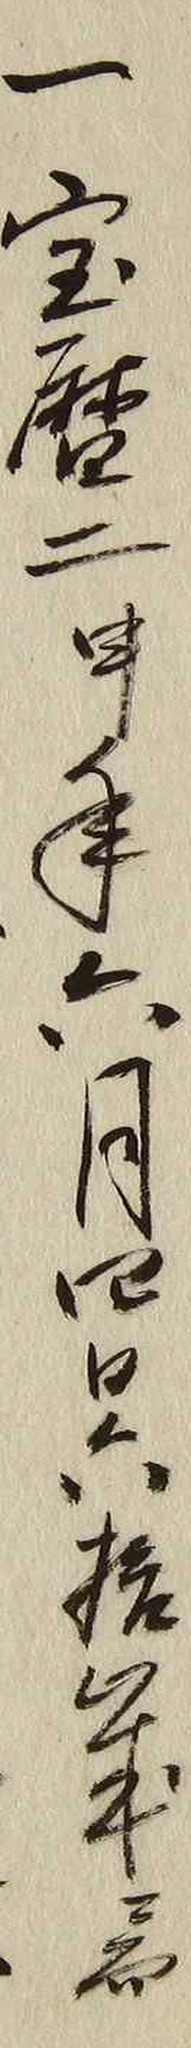一宝暦二申年六月四日六拾歳ニ而
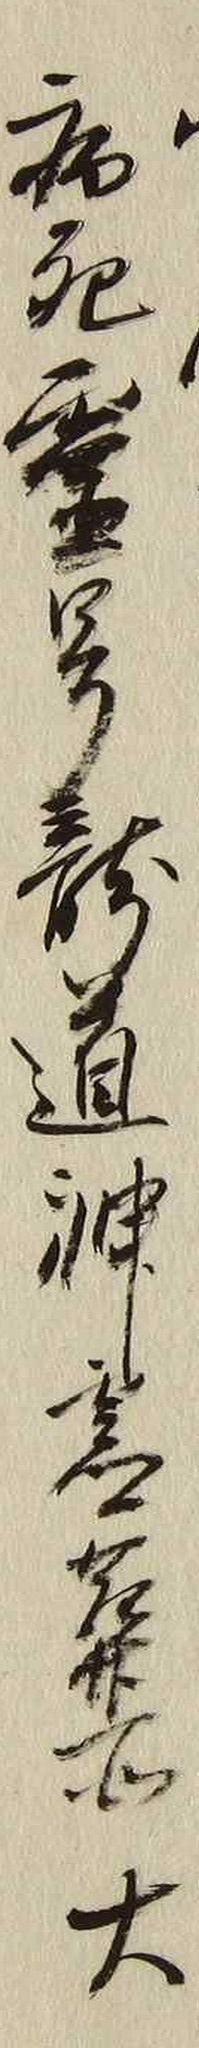病死霊号龍道神霊葬所大
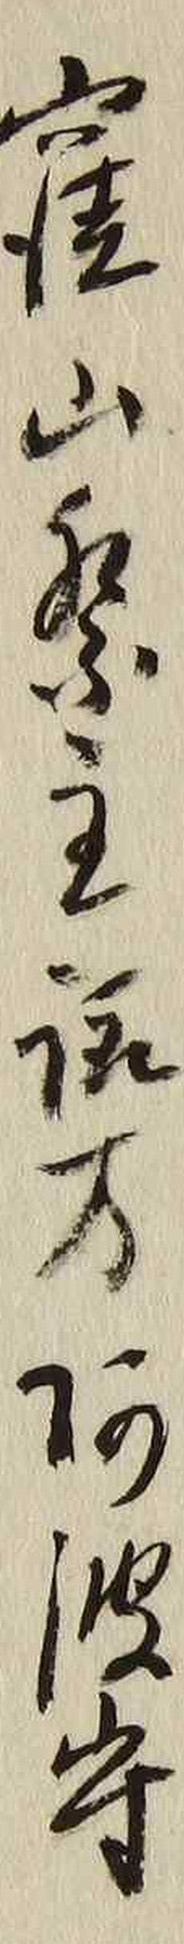窪山祭主諏方阿波守
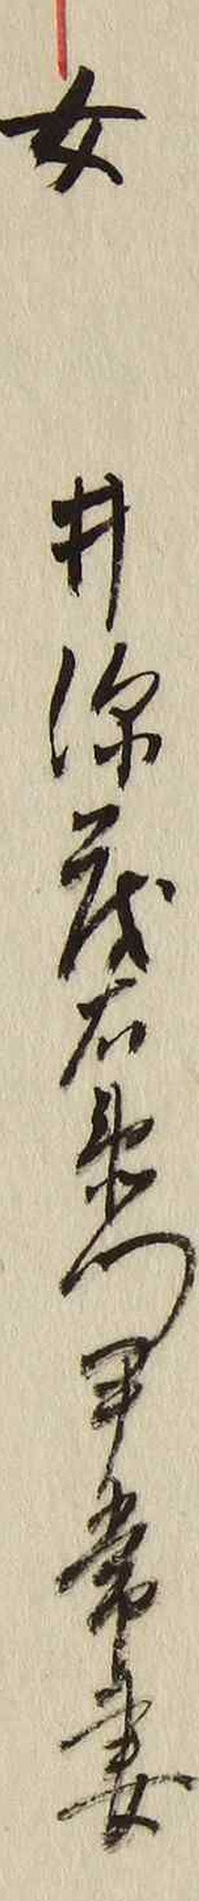女井深茂右衛門尹常妻
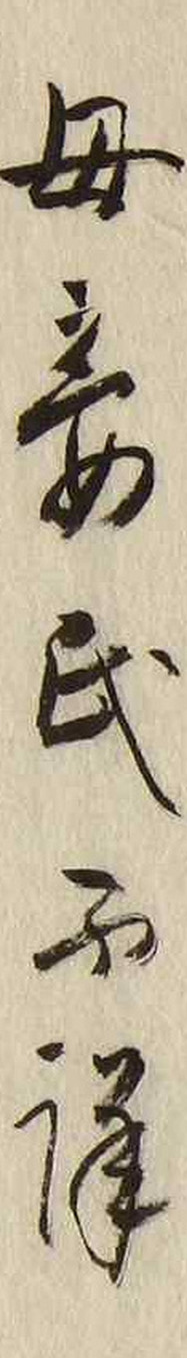母妾氏不詳

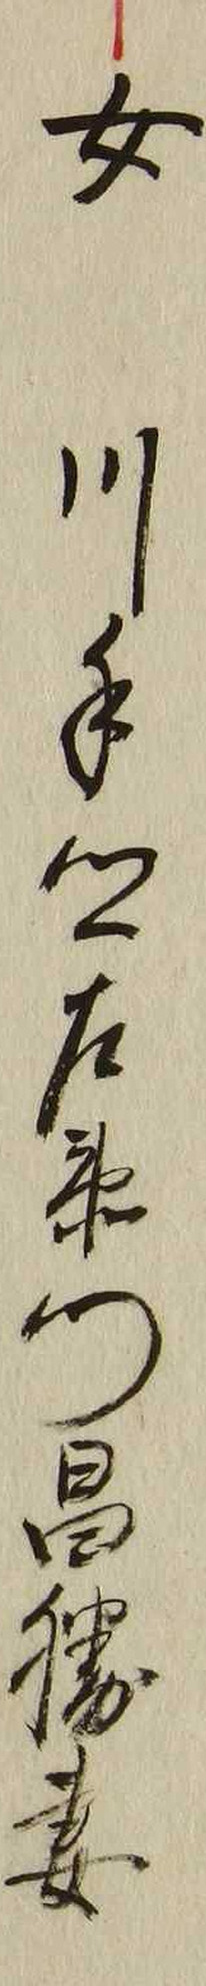女川手郷左衛門昌勝妻
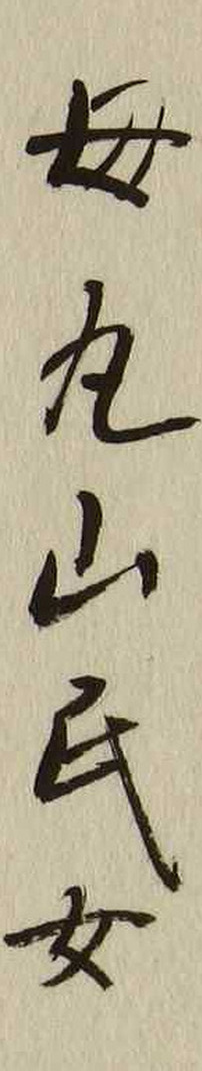母丸山氏女
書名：諸士系譜　巻之349　も之部5
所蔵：会津若松市立会津図書館
